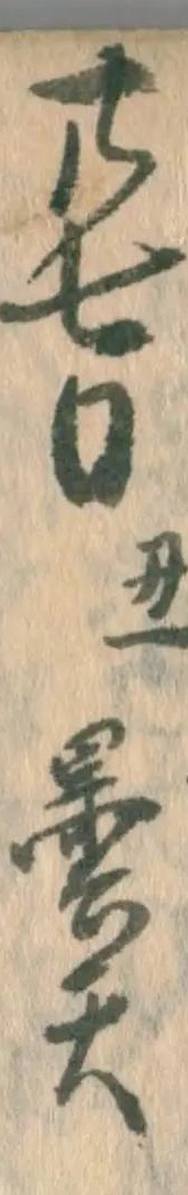廿七日丑曇天
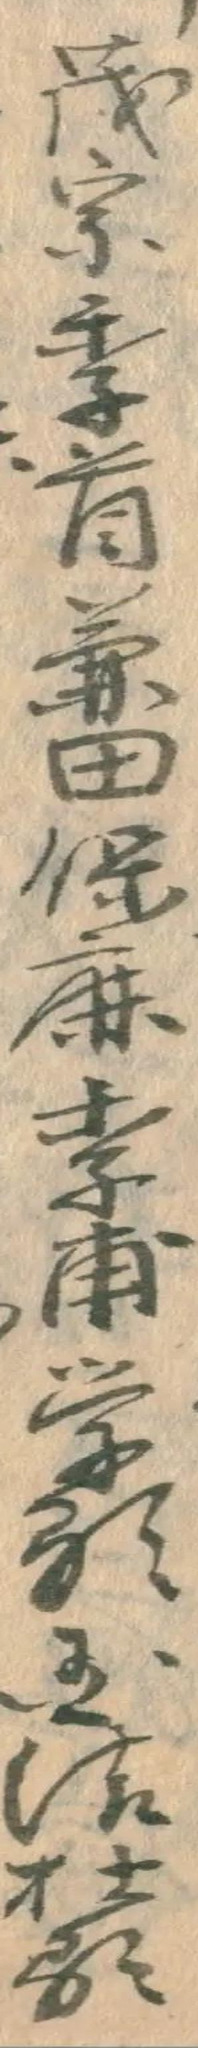茂宗季首兼田保鹿季甫学顕国清杜顕
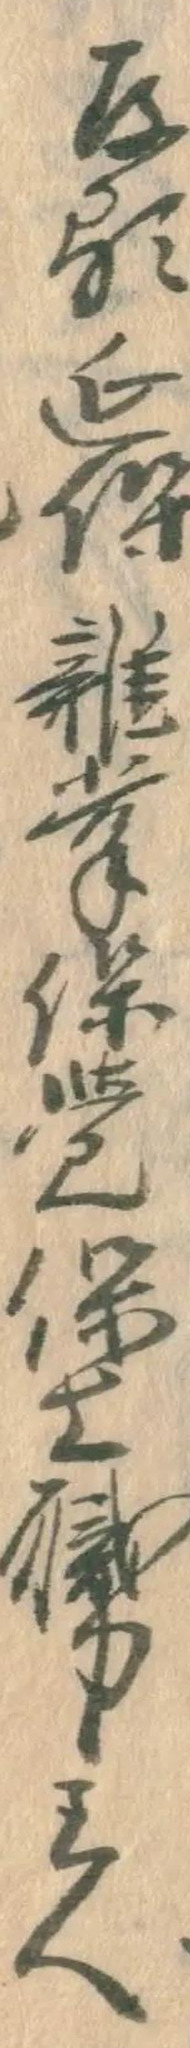存顕延保雑掌保覚保土職中三人
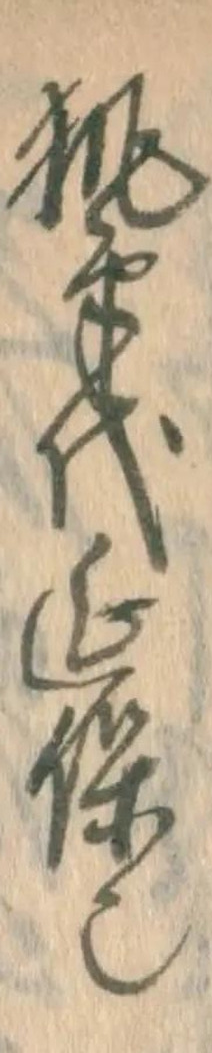執筆代存顕也
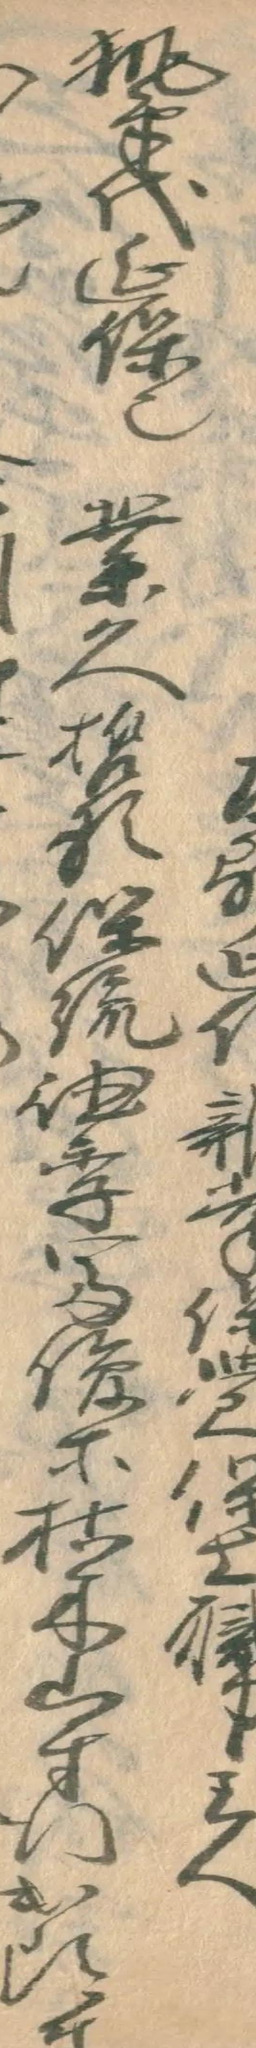執筆代延保也業久哲顕保統徳季富俊等枯木山奉行出頭ニ付
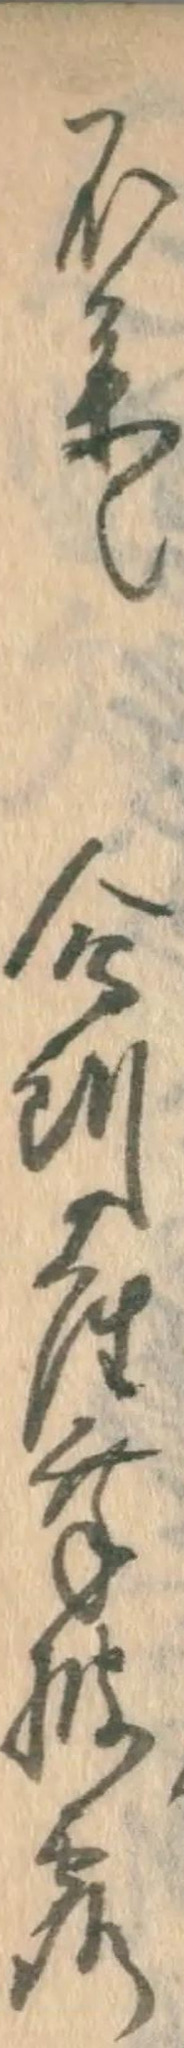不参也会所産幸披露

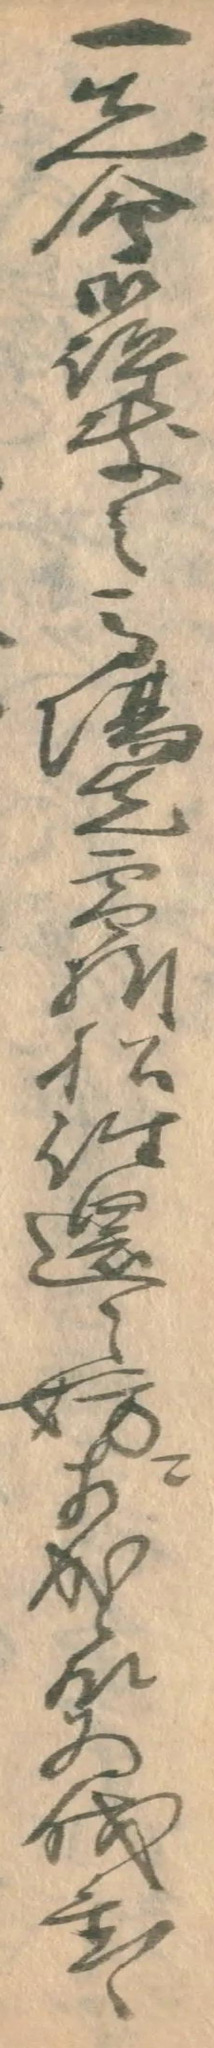一先会御評決所之馬場先雪折松往還之妨ニ相成候故為伐置候
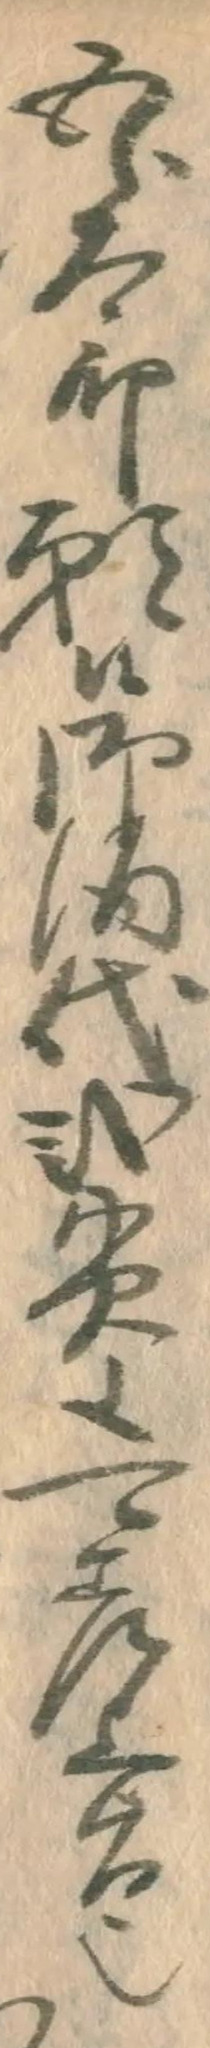五郎太郎願候御酒代弐貫文可差上旨也
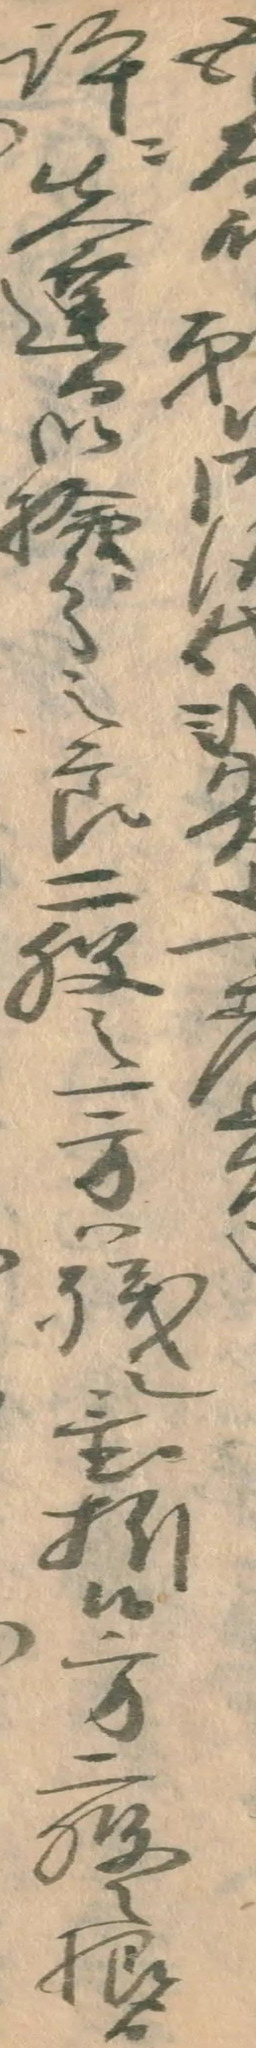評ニ先達而御検分之節二股之一方ハ残シ置折抔候方二股之根ゟ
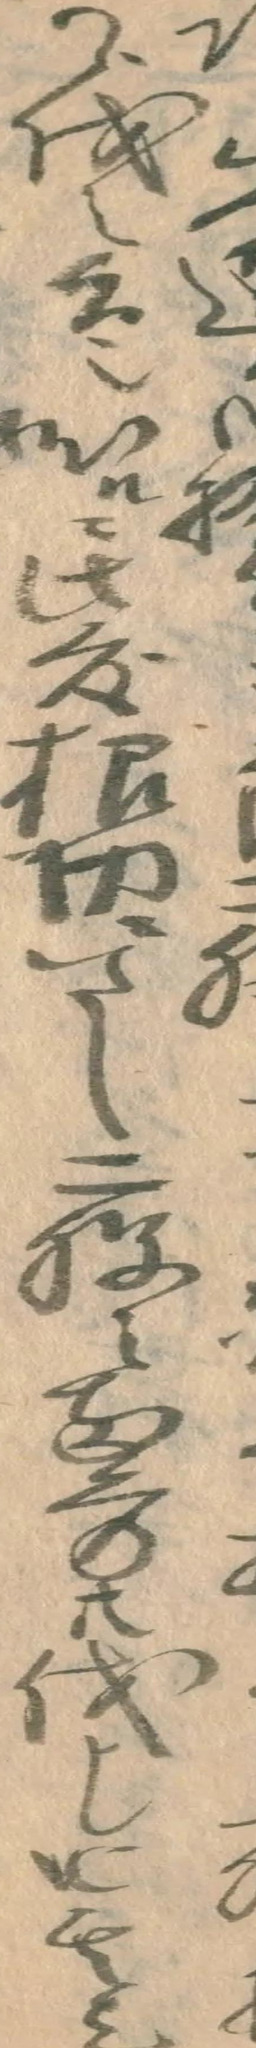可被伐之旨也然ルニ此度根切ニいたし二股之両方共伐申候由其上
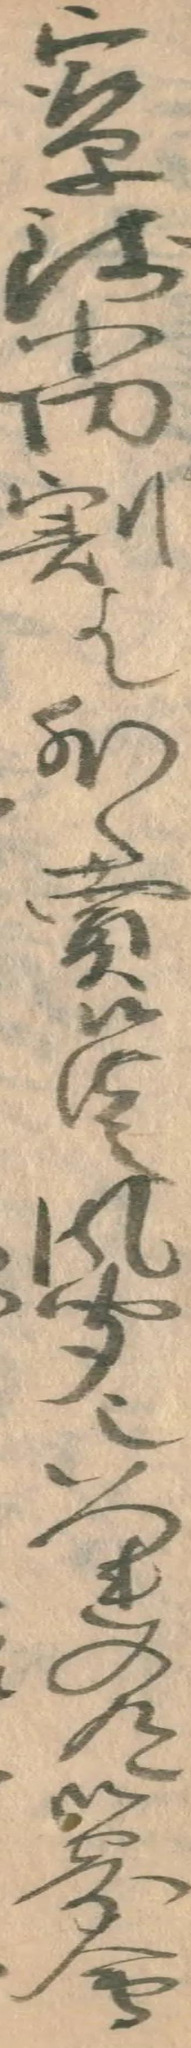最早致小切割候て外へ売候由之風聞也いつれの道御寄会
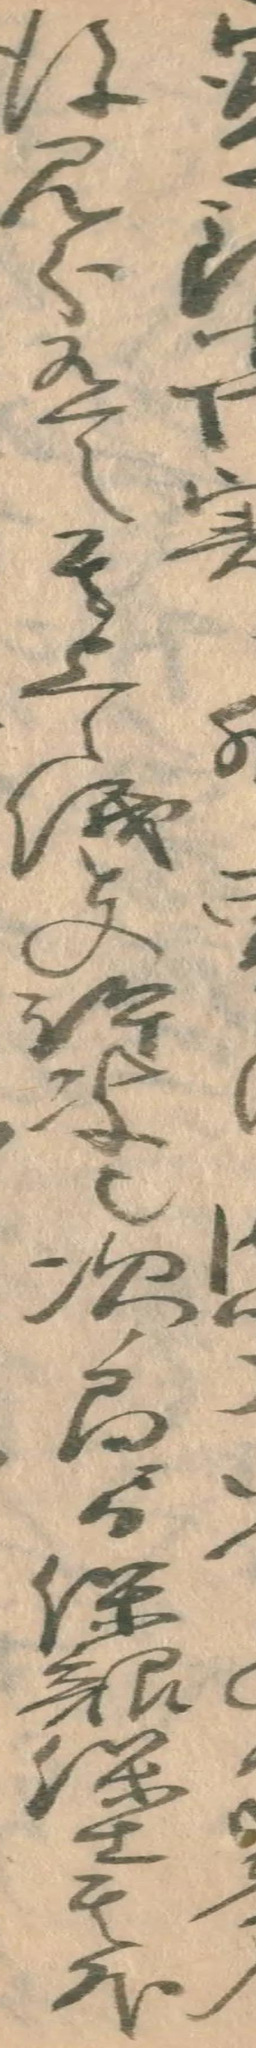後見分有之其上之儀との評決也次ノ間ニ而保韶深土其外
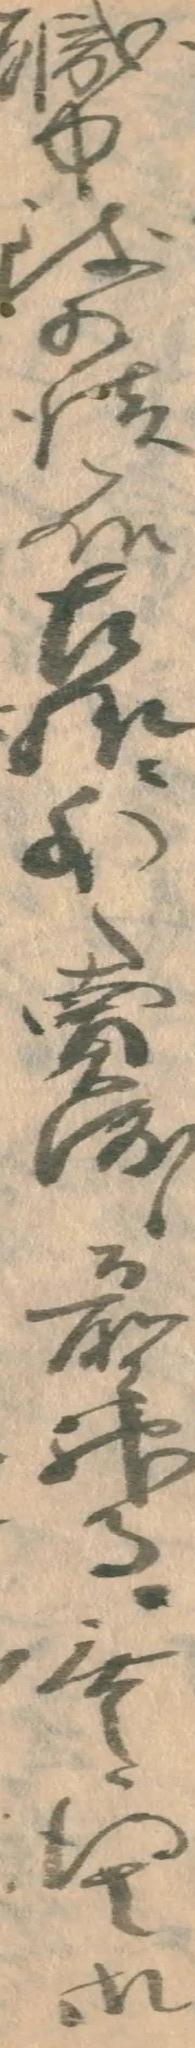職中致相談候処左様ニ外へ売渡候而聖神寺ニ無之候得者御
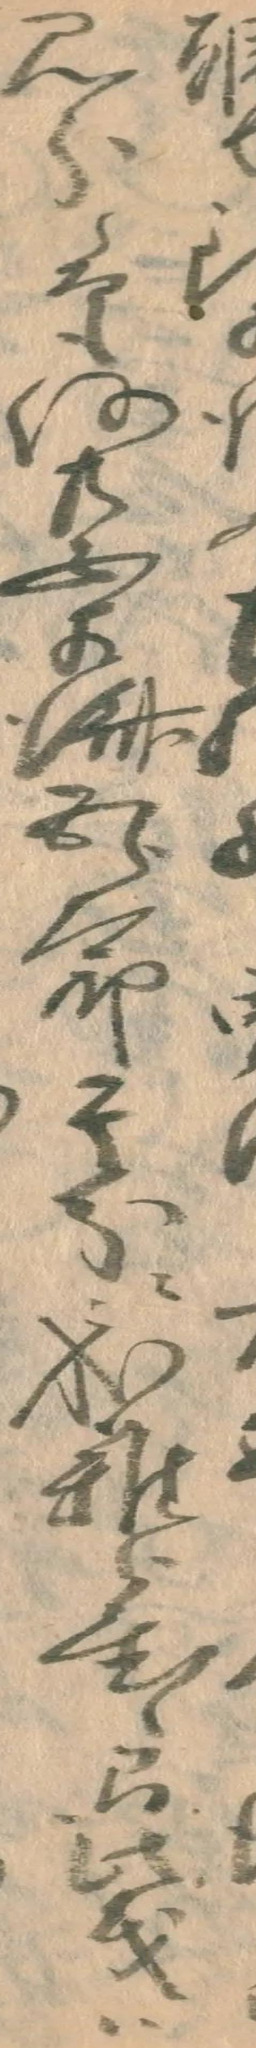見分候而も何共不相済五郎太郎其分ニ成難被置候間此義ハ
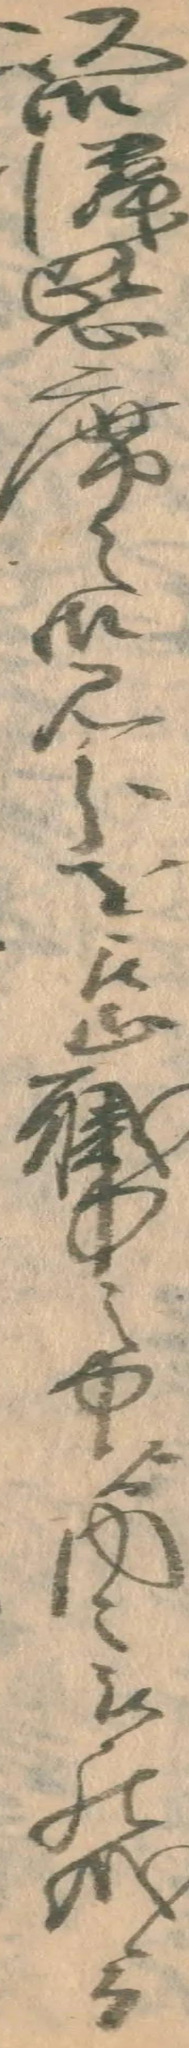以御憐愍席之御見分を被止職中之中ゟ内々被罷越候而
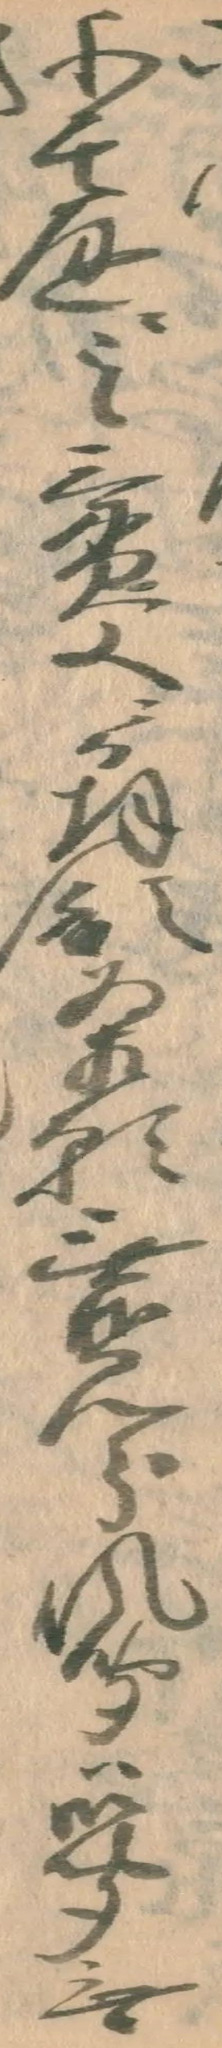弥其通ニ候ハヽ三貫文ニ而拝領為相願無御見分風聞ハ御聞無
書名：賀茂社記録. 第60冊
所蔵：国立国会図書館 National Diet Library, JAPAN
